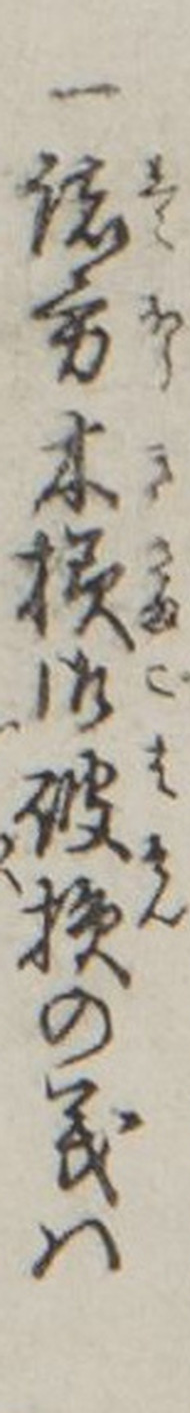一諸方木様御破損の義は
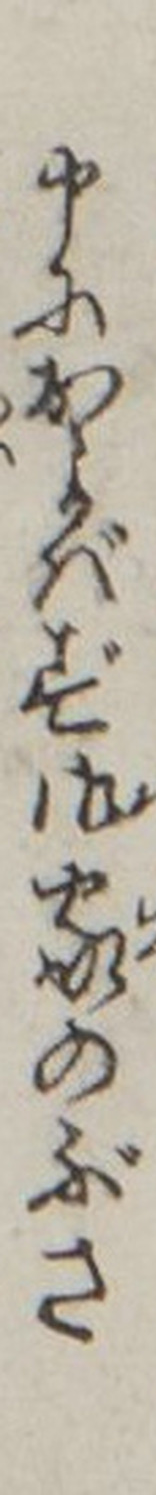申におよばず御家のぶさ
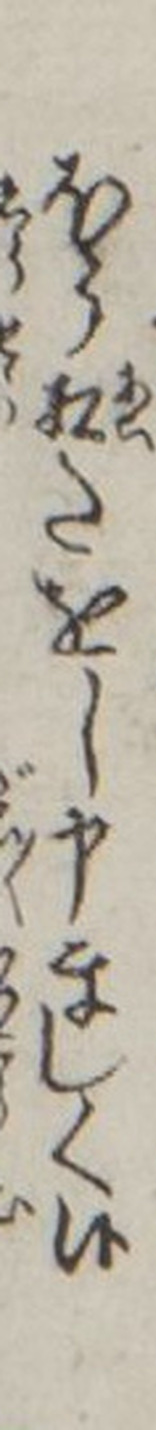ほう相たをし申ましく候
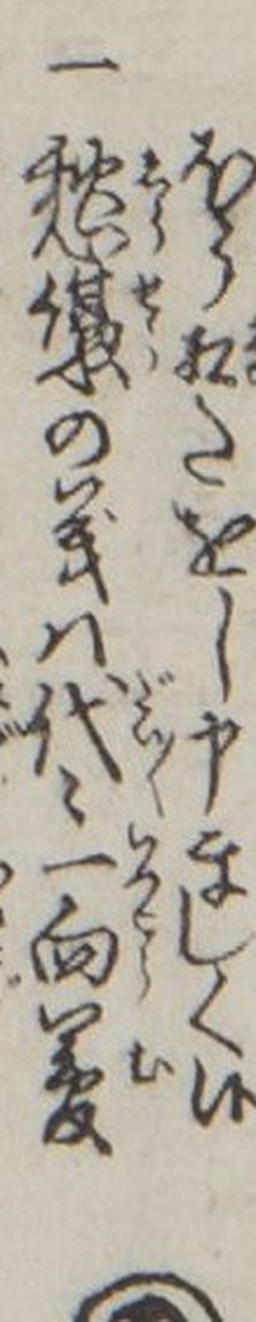一愁傷の義は代々一向夢
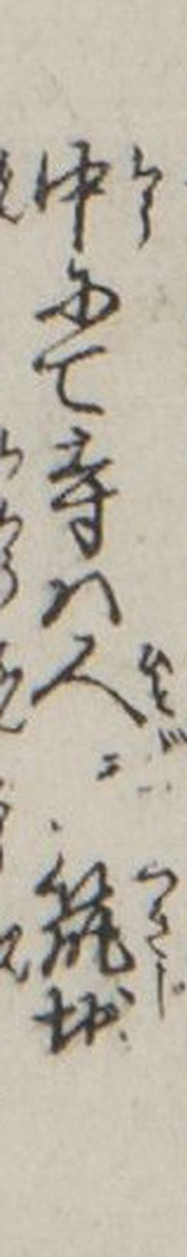中にて寺は人築地
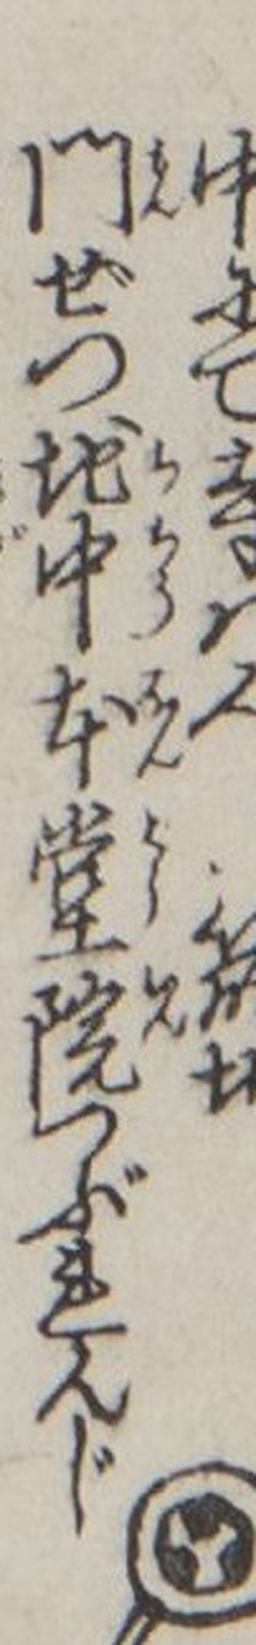門ぜつ地中本堂院つぶれんじ
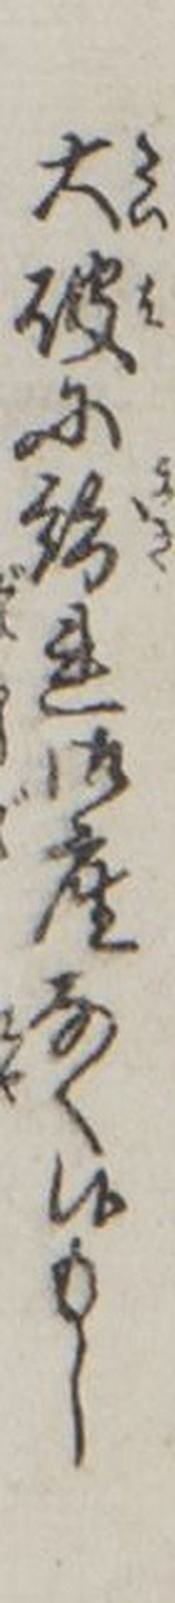大破に紛れ御座なく候もし
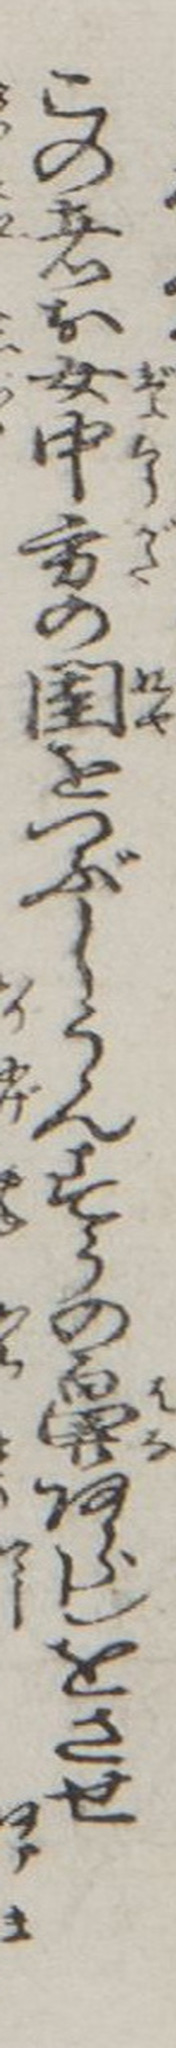この者お女中方の閨をつぶしうんすうの鼻あらしをさせ
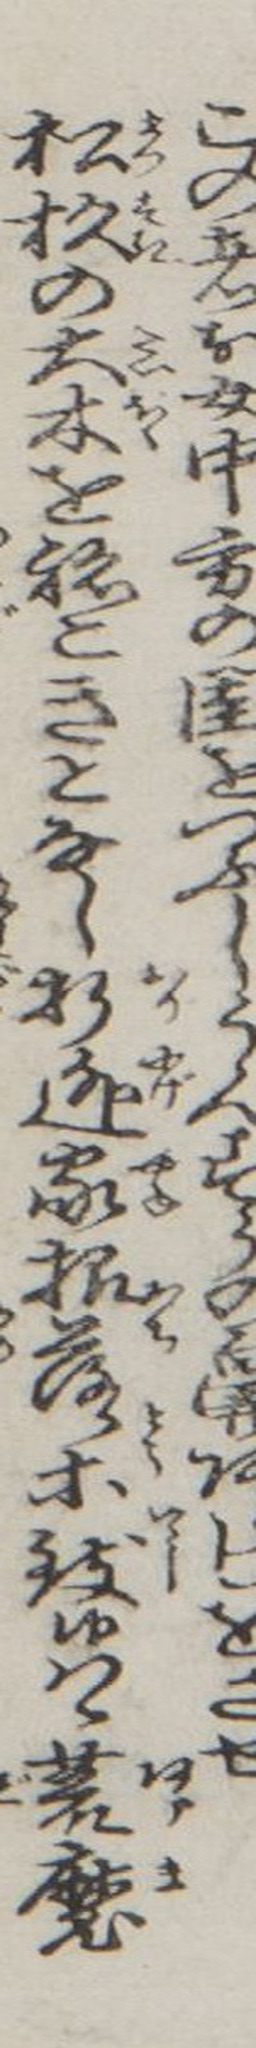松杉の大木をねこきとなし折逃屋根落等致候はゝ荒魔
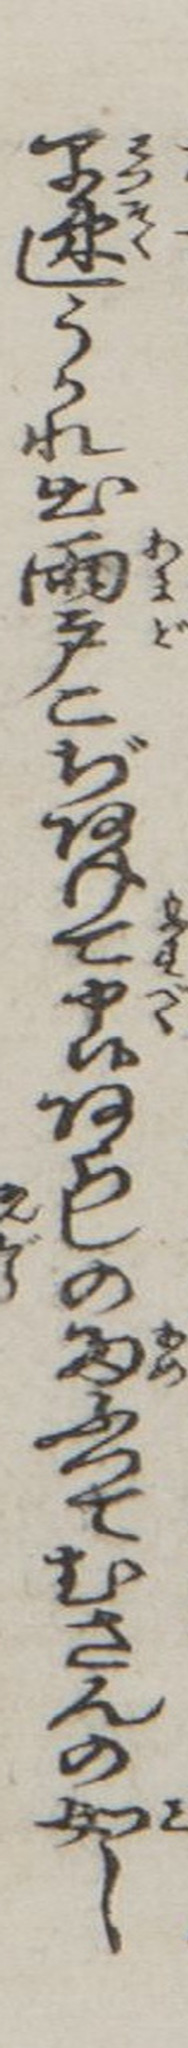早速うかれ出雨戸こぢあけ可申候あらしの雨ふつてむさんの如し
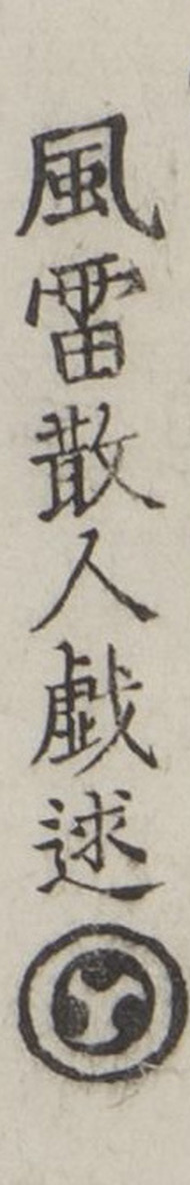風雷散人戯述
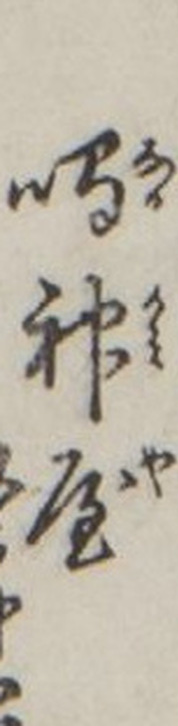鳴神屋
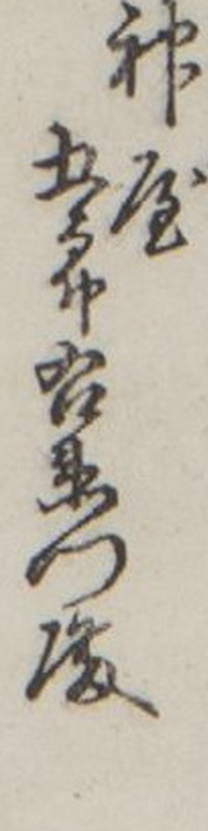五郎右衛門殿
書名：家苦ばらい／ほうぼうへ逃状の事
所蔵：あいおいニッセイ同和損保株式会社
